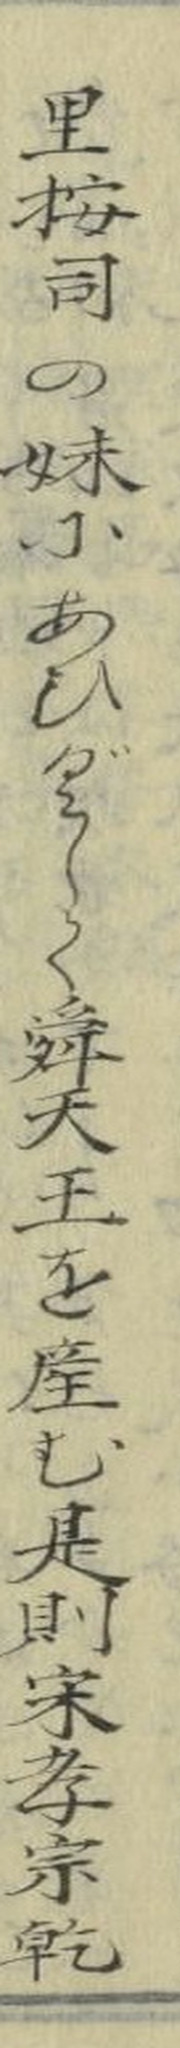里按司の妹にあひぐして舜天王を産む是則宋考宗乾
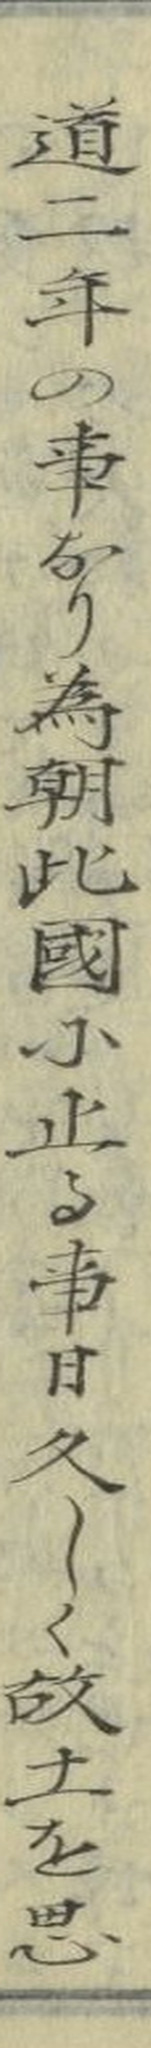道二年の事なり為朝此国に止る事日久しく故土を思
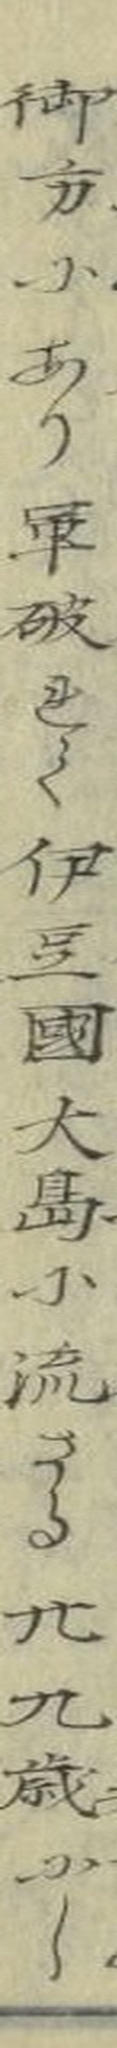御方にあり軍破れて伊豆国大島に流さる廾九歳にし
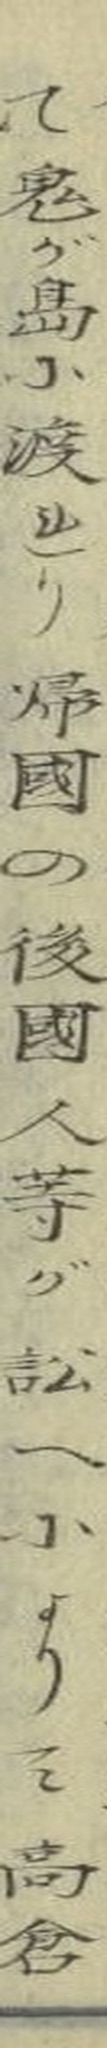て鬼が島に渡れり帰国の後国人等が訟へによりて高倉
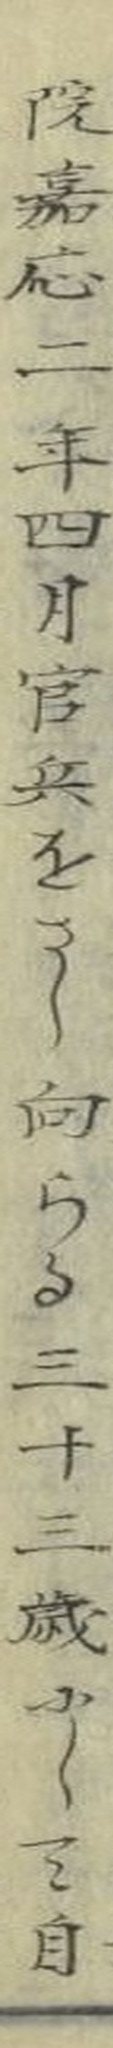院嘉応二年四月官兵をさし向らる三十三歳にして自
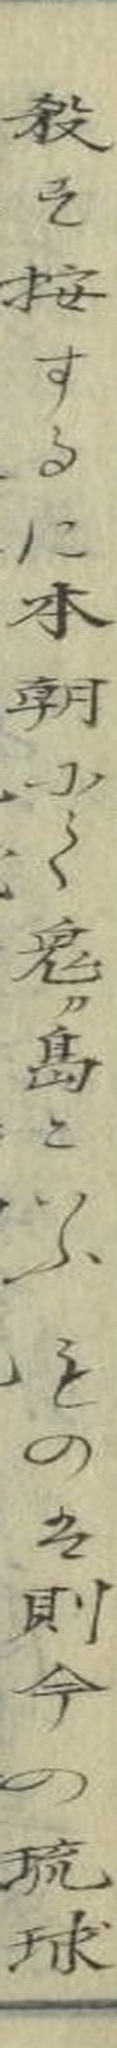殺す按するに本朝にて鬼ヵ島といふものは則今の琉球
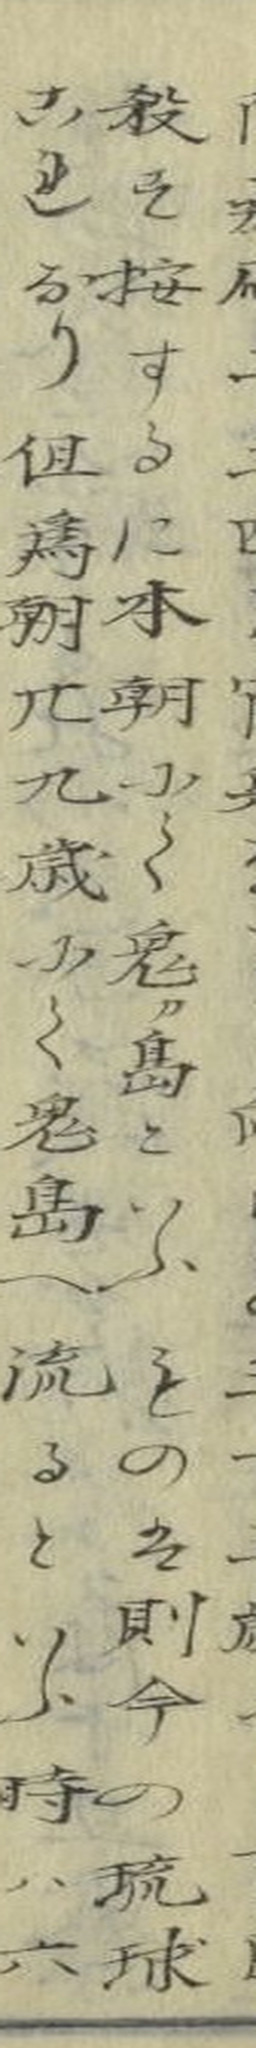これなり但為朝廾九歳にて鬼島へ流るといふ時は六
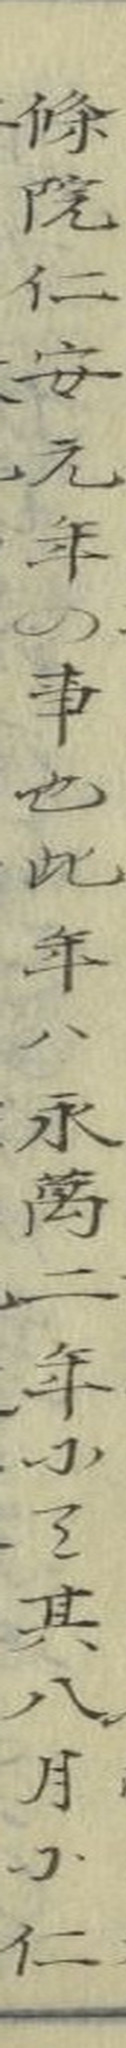條院仁安元年の事也此年は永万二年にて其八月に仁
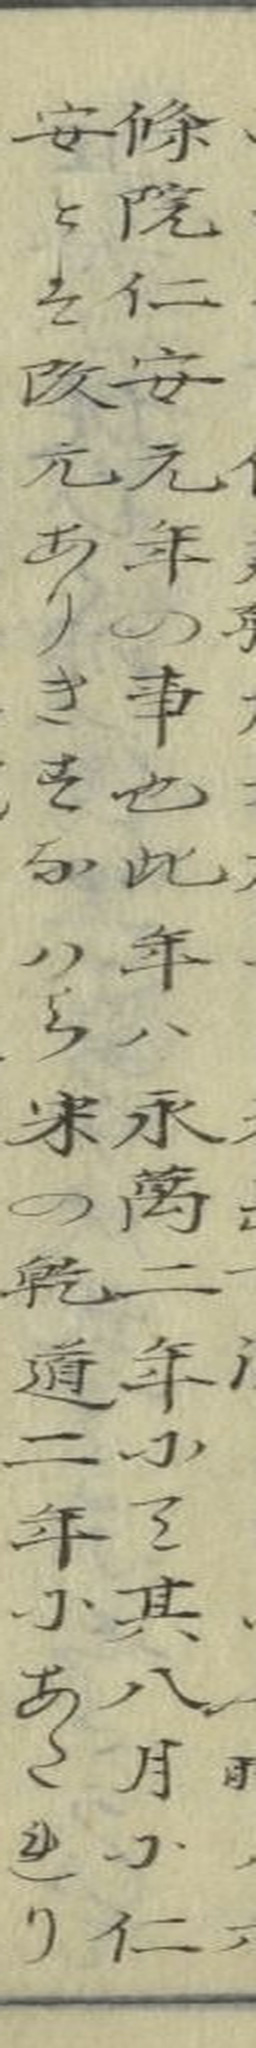安とは改元ありきすなはち宋の乾道二年にあたれり
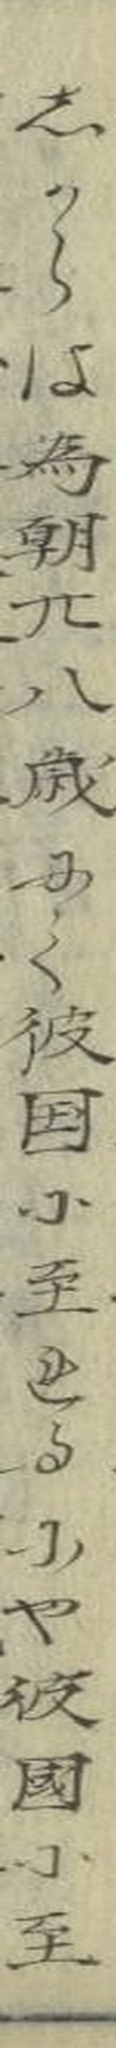しからは為朝廾八歳にて彼国に至れるにや彼国に至
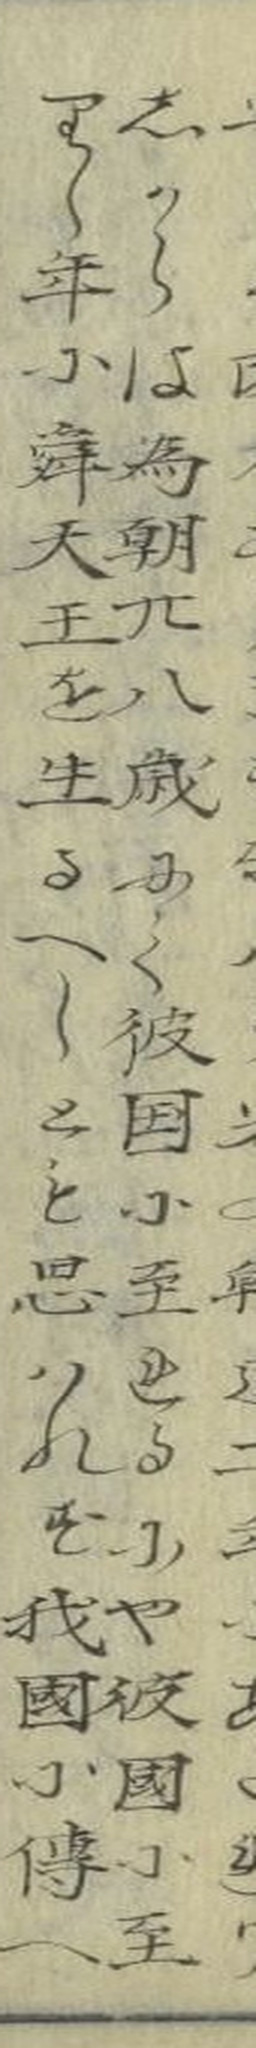りし年に舜天王を生るへしとも思はれず我国に伝へ

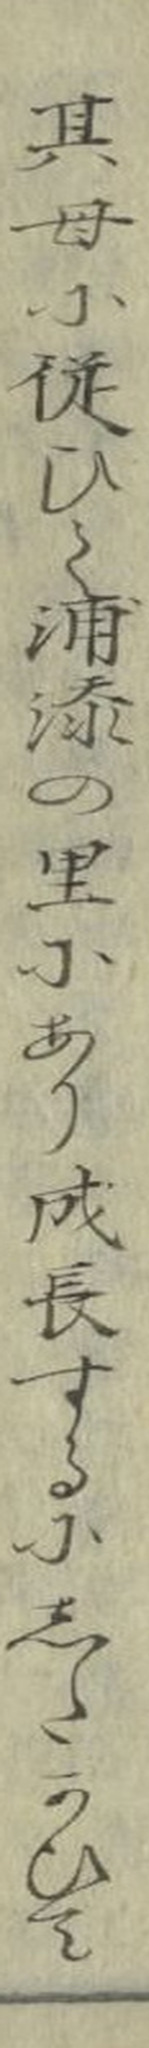其母に従ひて浦添の里にあり成長するにしたかひて
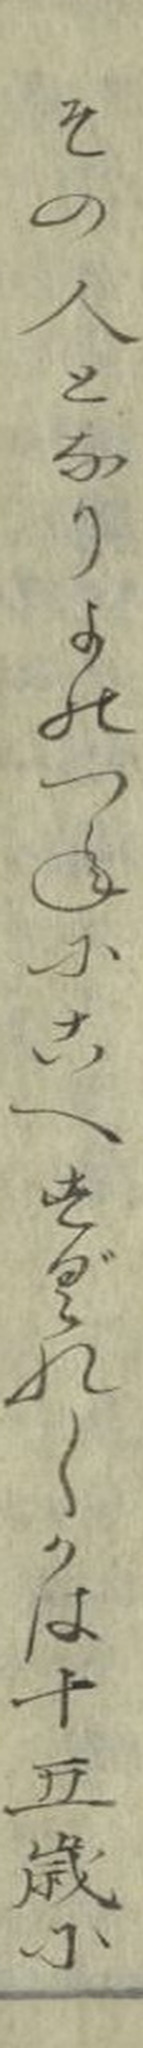その人となりよのつねにこへすぐれしかは十五歳に
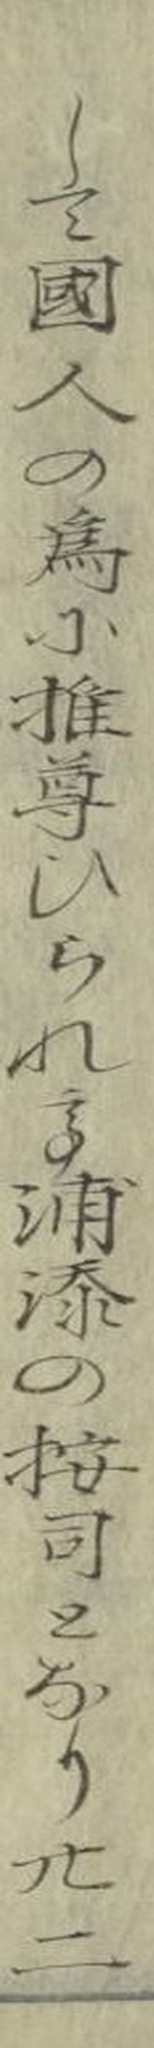して国人の為に推尊ひられて浦添の按司となり廾二
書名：琉球沿革志 下
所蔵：University of the Ryukyus Library
